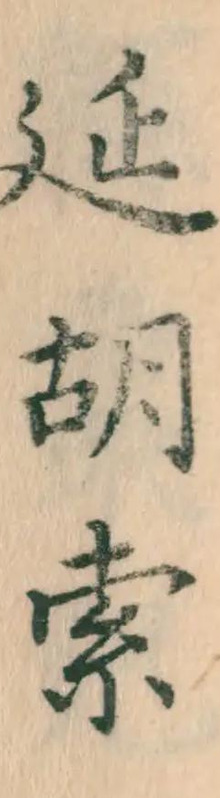延胡索

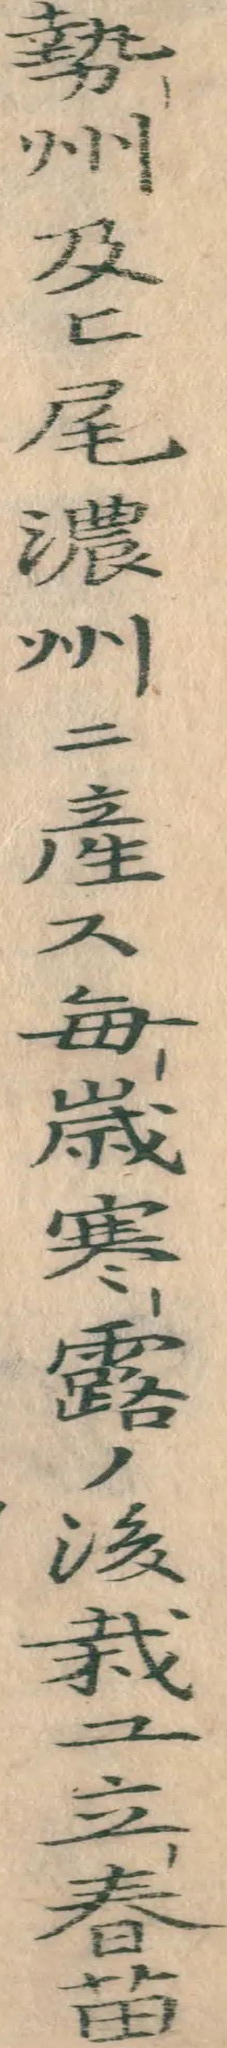勢-州及ヒ尾濃州ニ産ス毎-歳寒-露ノ後栽ユ立-春苗
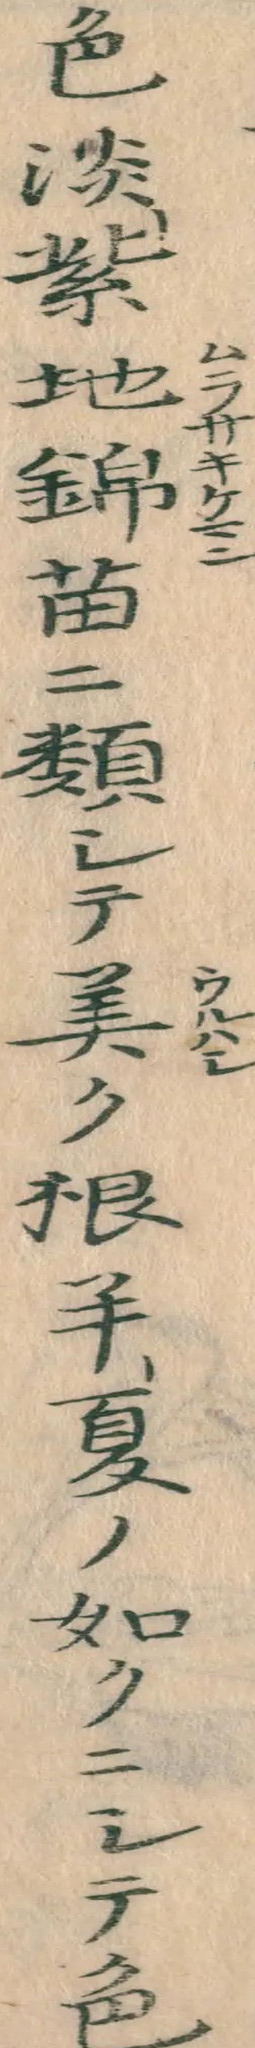色淡-紫地錦苗ニ類シテ美ク根半-夏ノ如クニシテ色
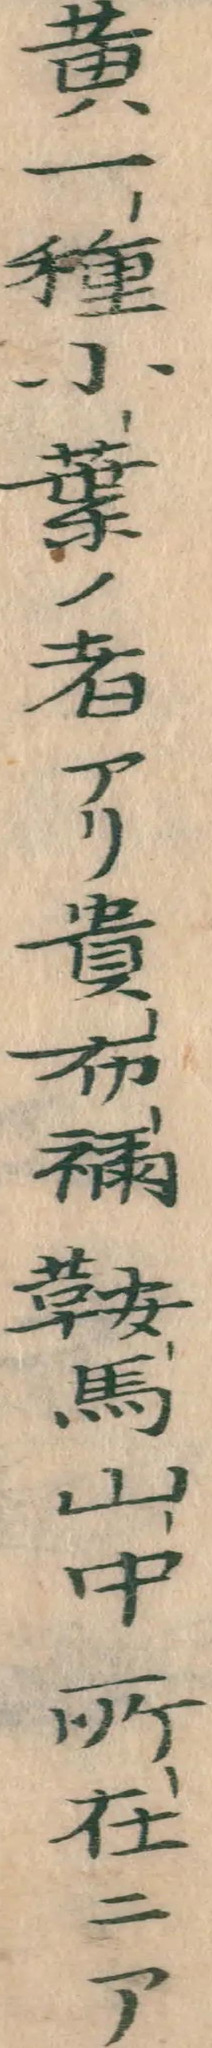黄一-種小-葉ノ者アリ貴-布-禰鞍-馬山-中所-在ニア
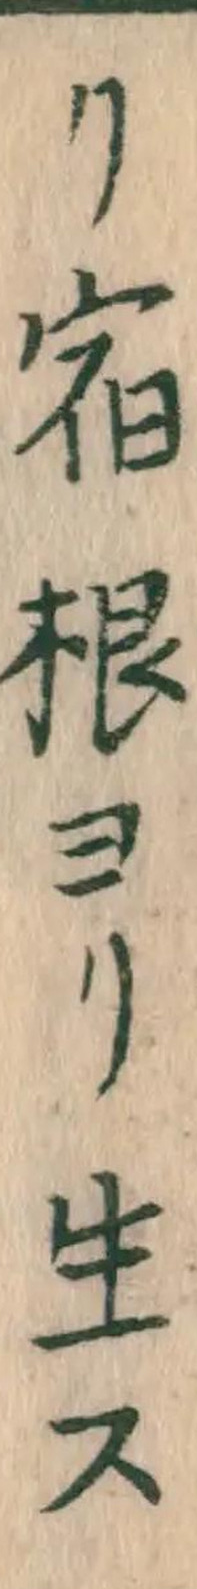リ宿根ヨリ生ス

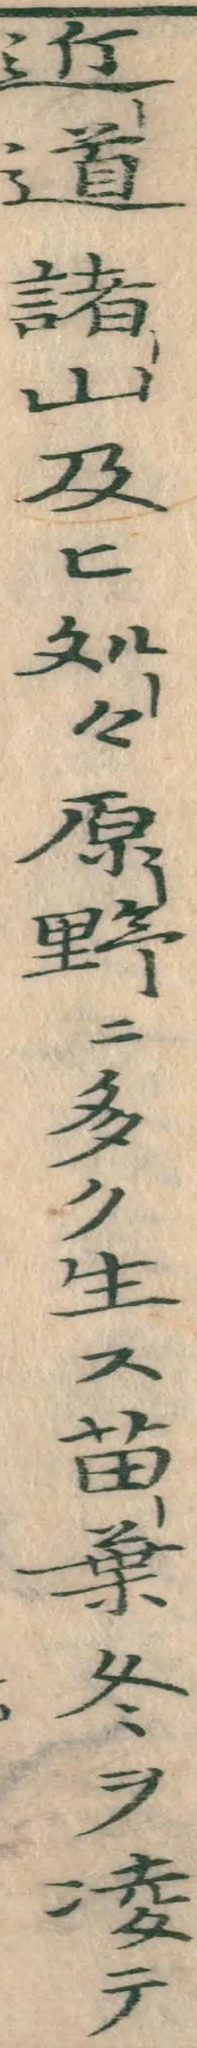近-道諸-山及ヒ処-々原-野ニ多ク生ス苗-葉冬ヲ凌テ
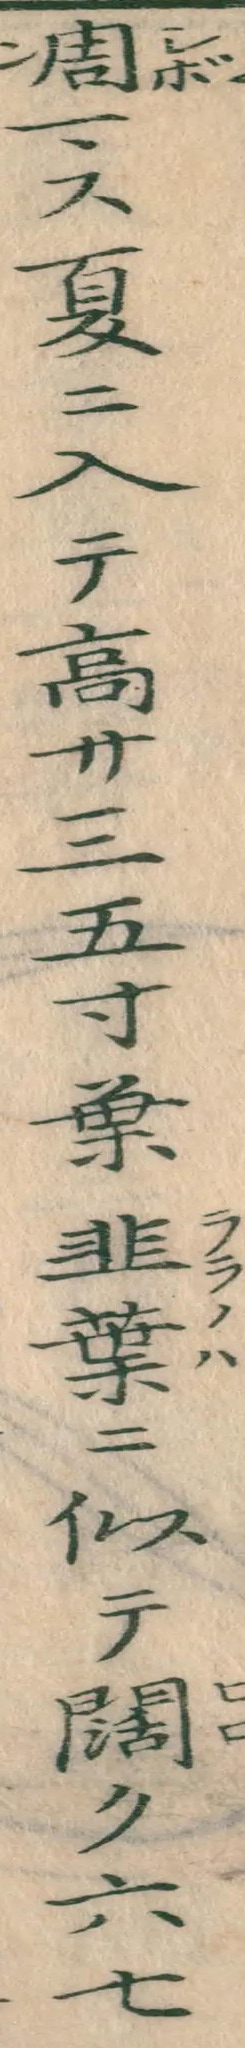凋マス夏ニ入テ高サ三五寸葉韭葉ニ似テ闊ク六七
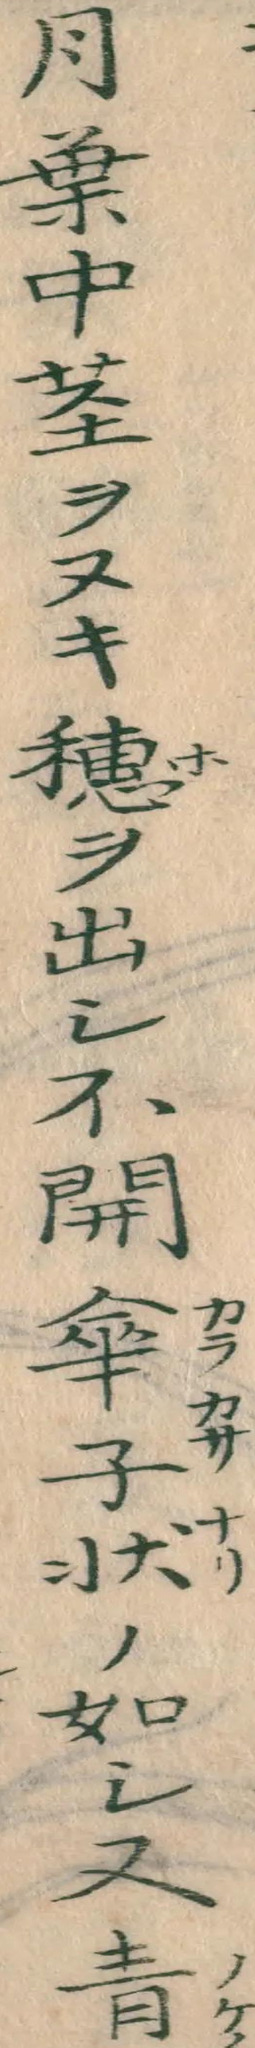月葉中茎ヲヌキ穂ヲ出シ不開傘子状ノ如シ又青
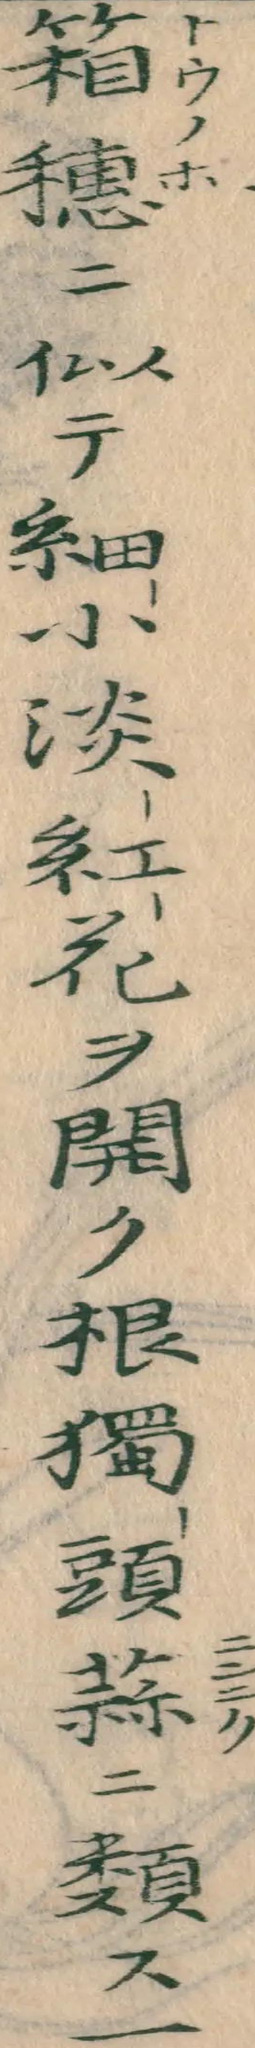箱穂ニ似テ細-小淡-紅-花ヲ開ク根独-頭蒜ニ類ス一

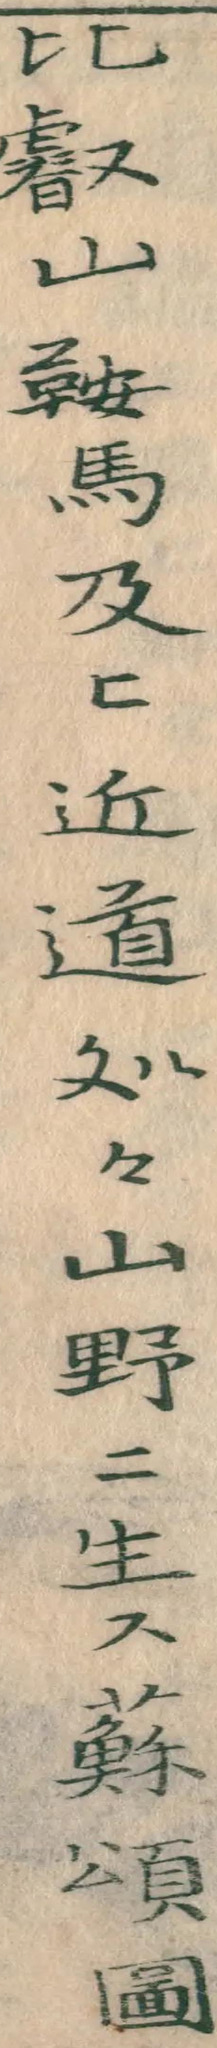比叡山鞍馬及ヒ近道処々山野ニ生ス蘇頌図
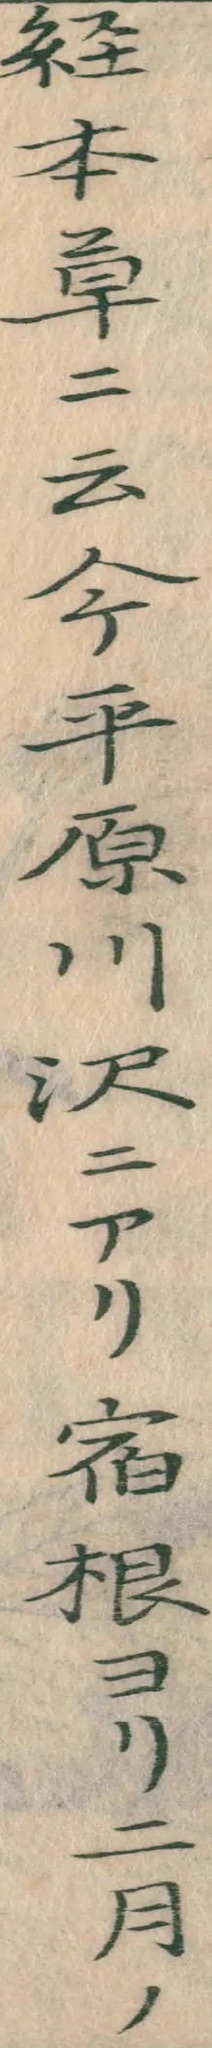経本草ニ云今平原川沢ニアリ宿根ヨリ二月ノ
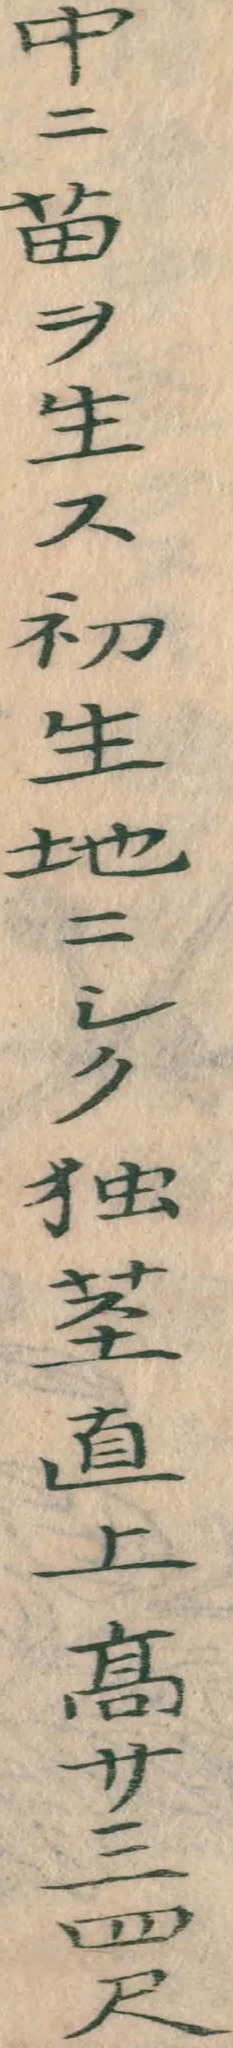中ニ苗ヲ生ス初生地ニシク独茎直上高サ三四尺
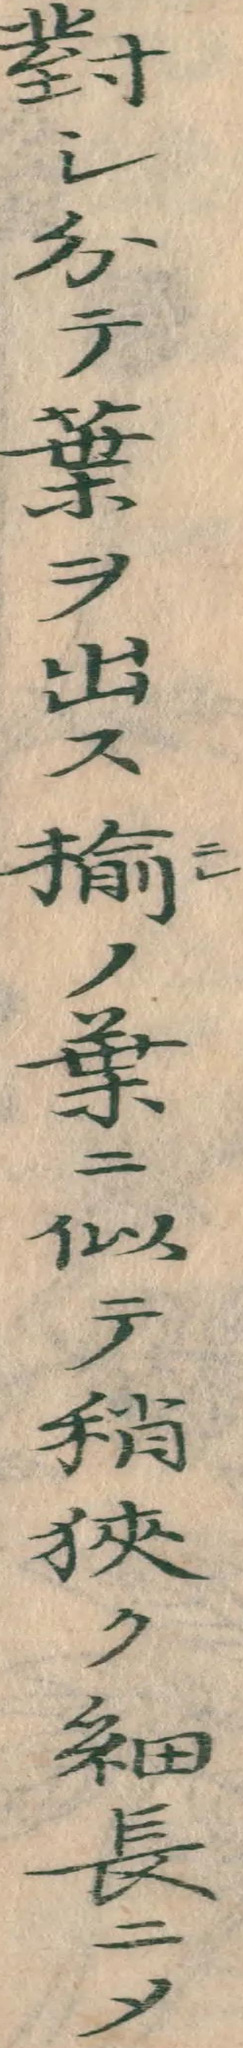対シ分テ葉ヲ出ス楡ノ葉ニ似テ稍狭ク細長ニシテ
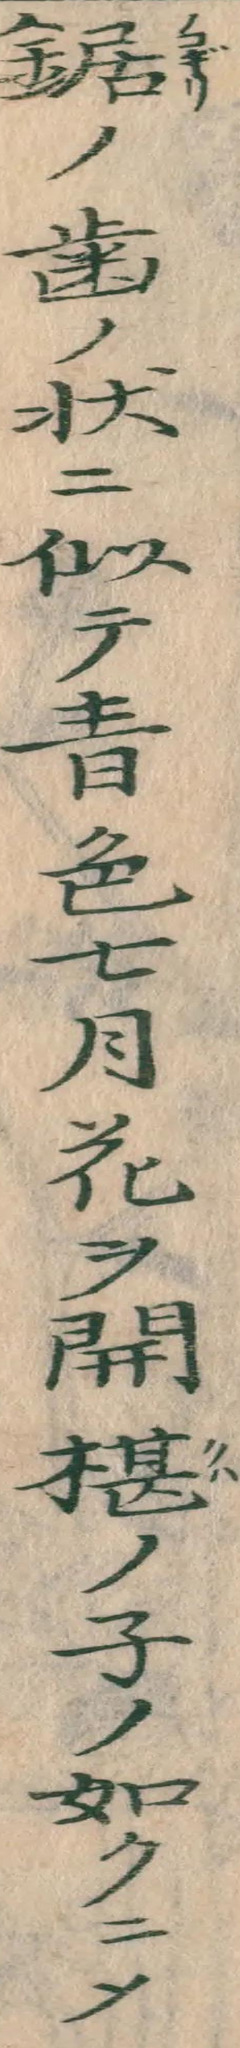鋸ノ歯ノ状ニ似テ青色七月花ヲ開椹ノ子ノ如クニシテ
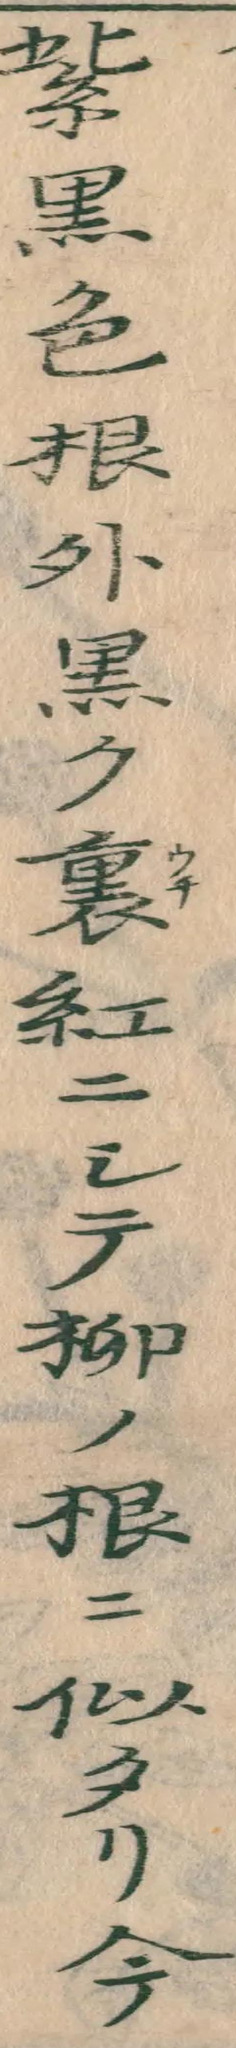紫黒色根外黒ク裏紅ニシテ柳ノ根ニ似タリ今
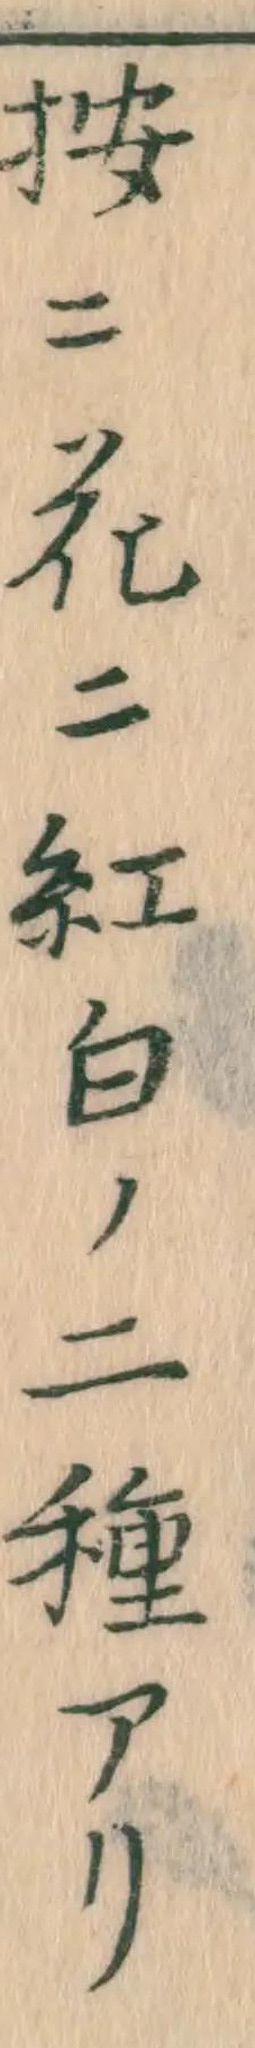按ニ花ニ紅白ノ二種アリ
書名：花彙 草部4巻木部4巻. [1]
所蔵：国立国会図書館 National Diet Library, JAPAN
